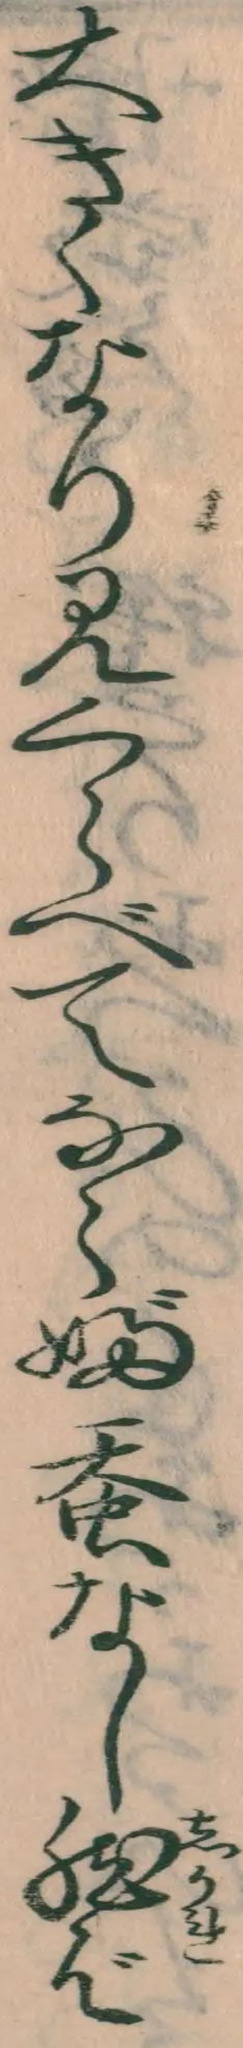大きくなり見くらべてならぶ蚕なし然ば
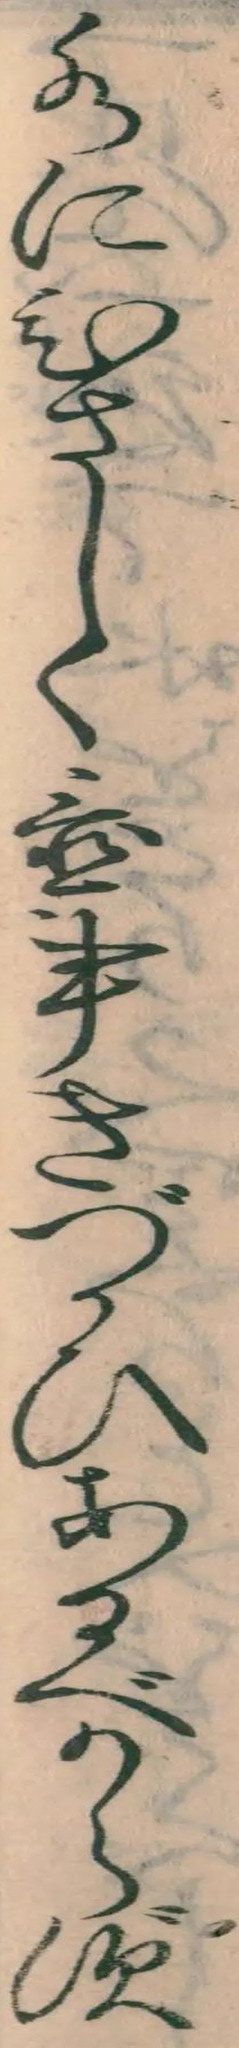水にひさしく置事きづかひあるべからず
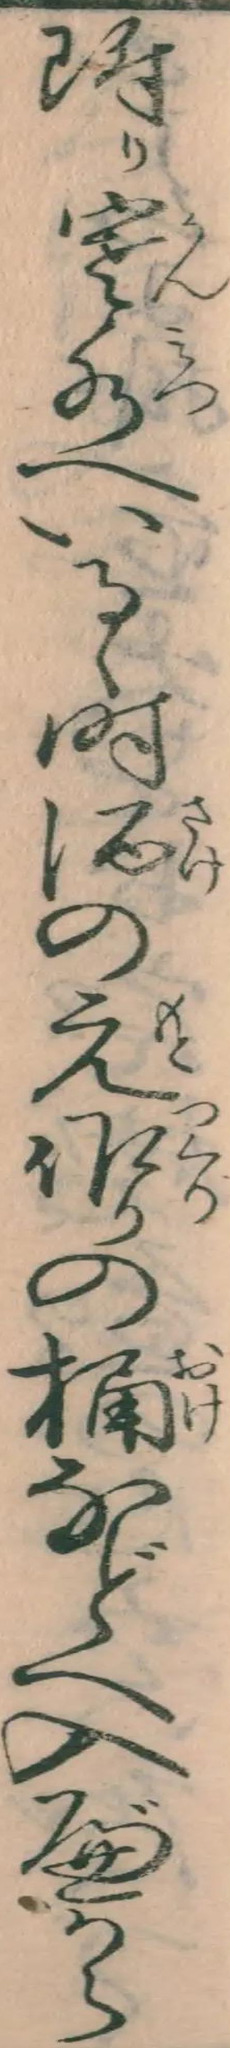附り寒水へいるゝ時酒の元作りの桶などへ入べから
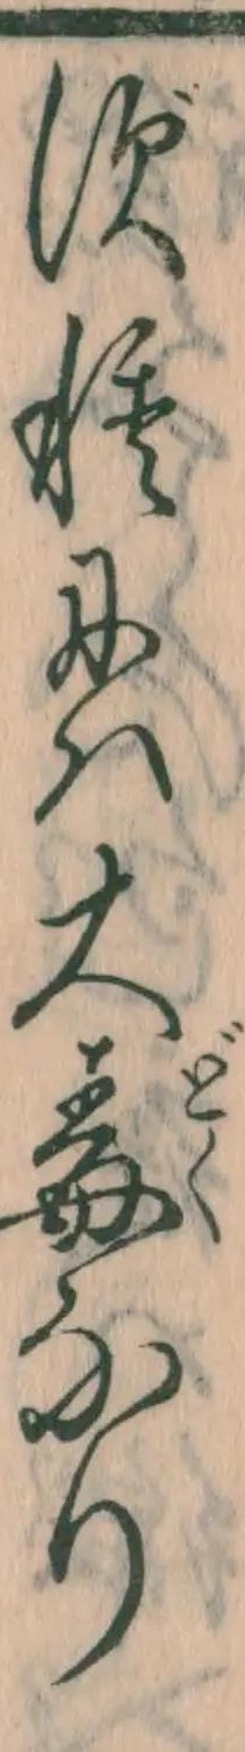す種には大毒なり
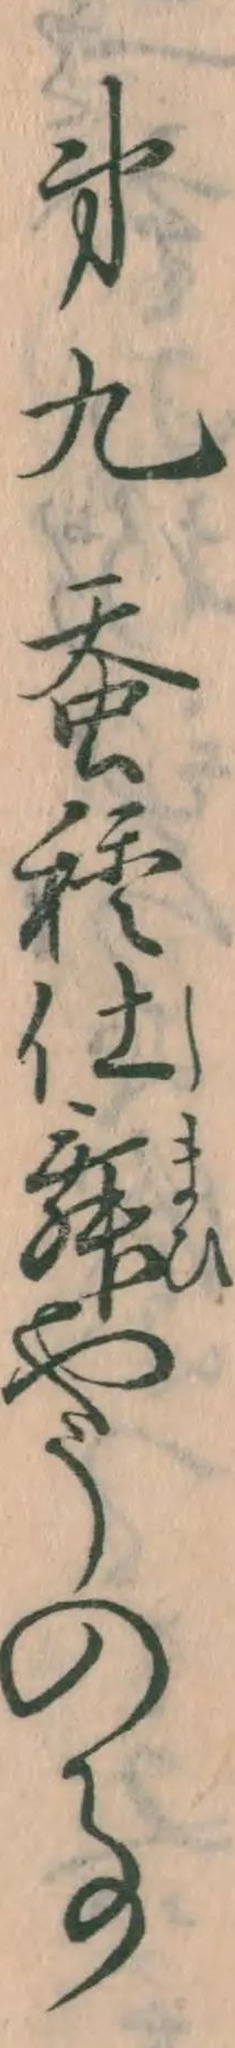第九蚕種仕舞やうの事
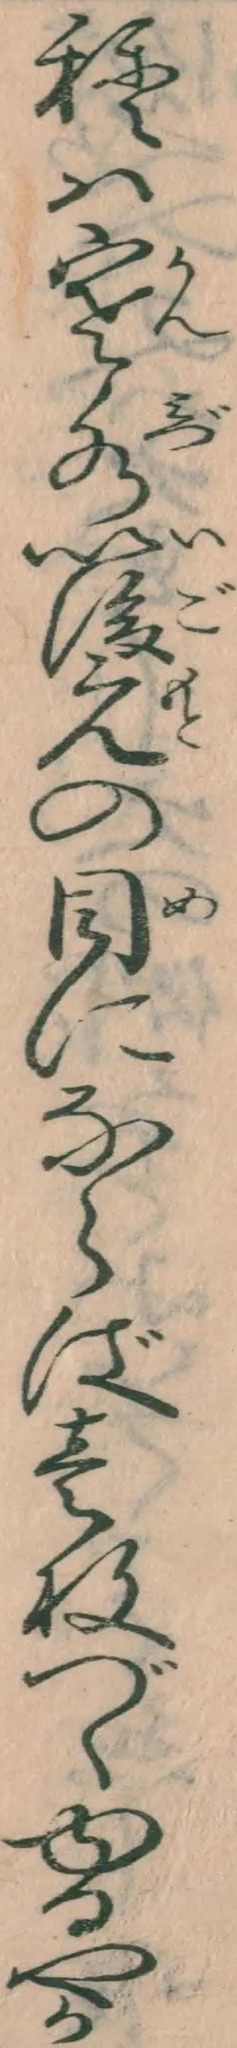種は寒水以後元の目にならば壱枚づゝゆるやか
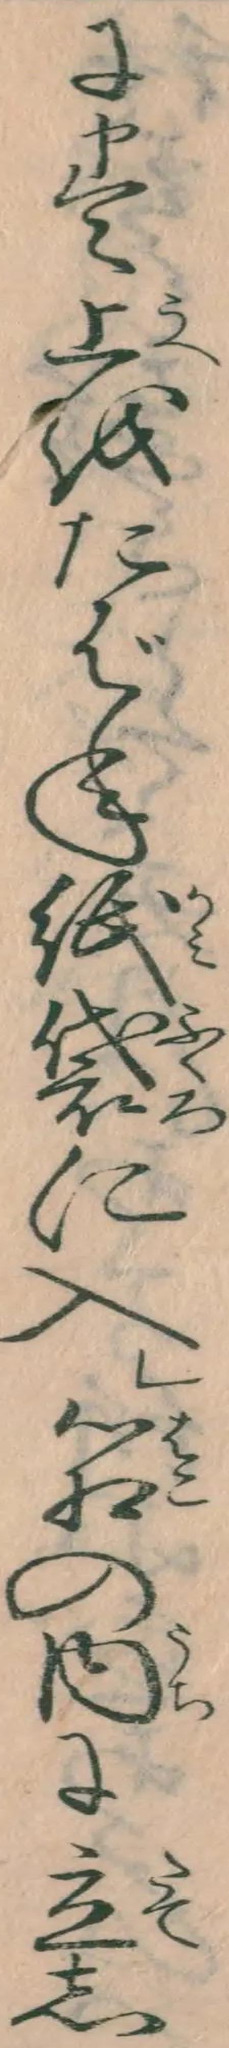に巻上をたばね紙袋に入れ箱の内に立し
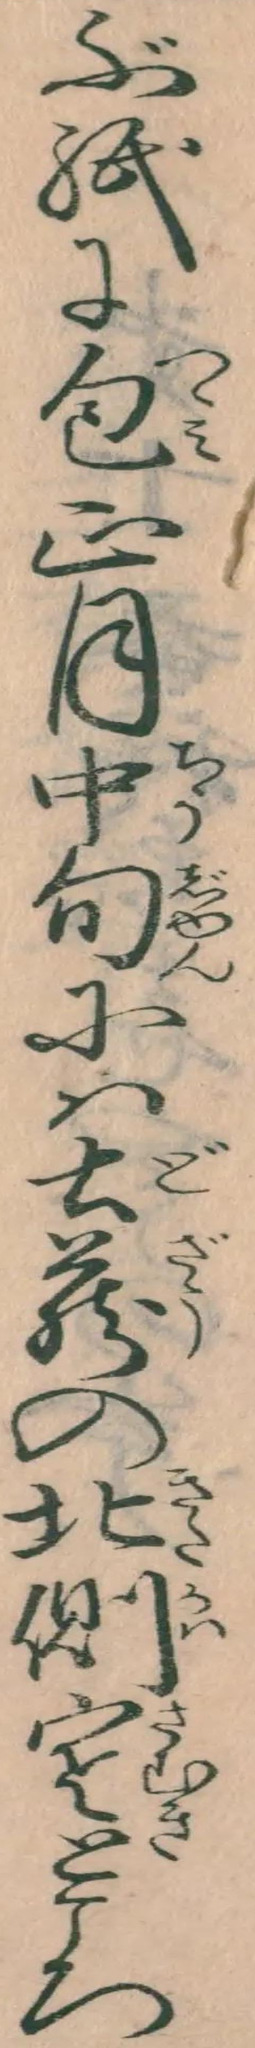ぶ紙に包正月中旬には土蔵の北側寒ところ
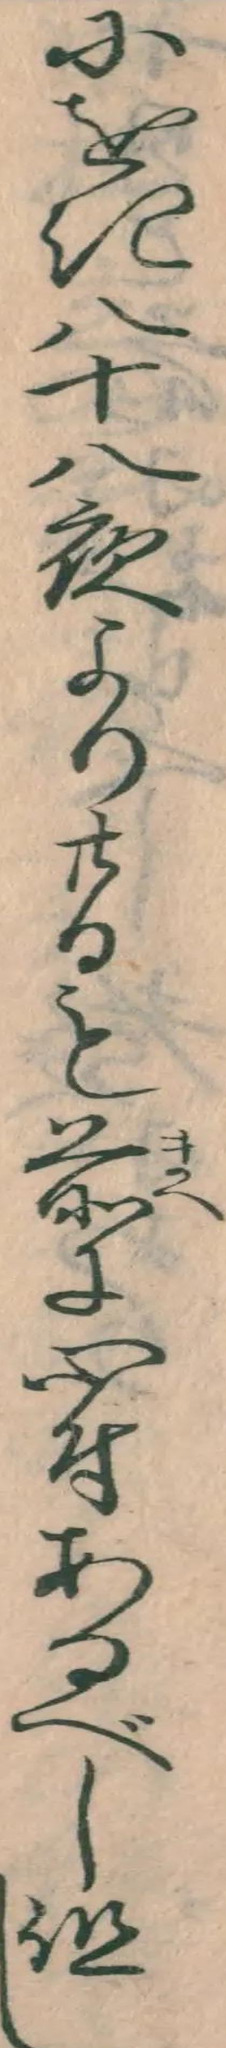にをき八十八夜より廿日も前に心付あるべし但し
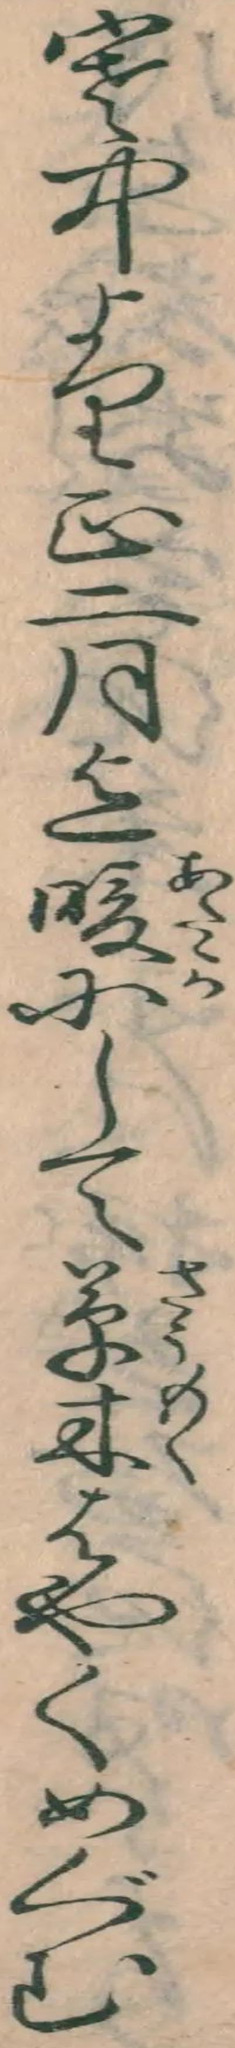寒中より正二月迄暖にして草木はやくめぐむ
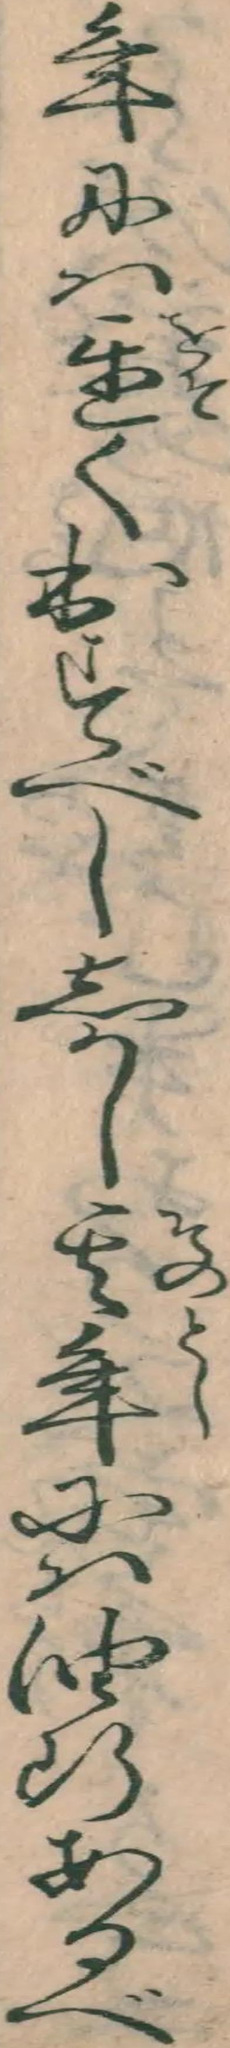年には遅く出すべししかし其年には油断あるべ

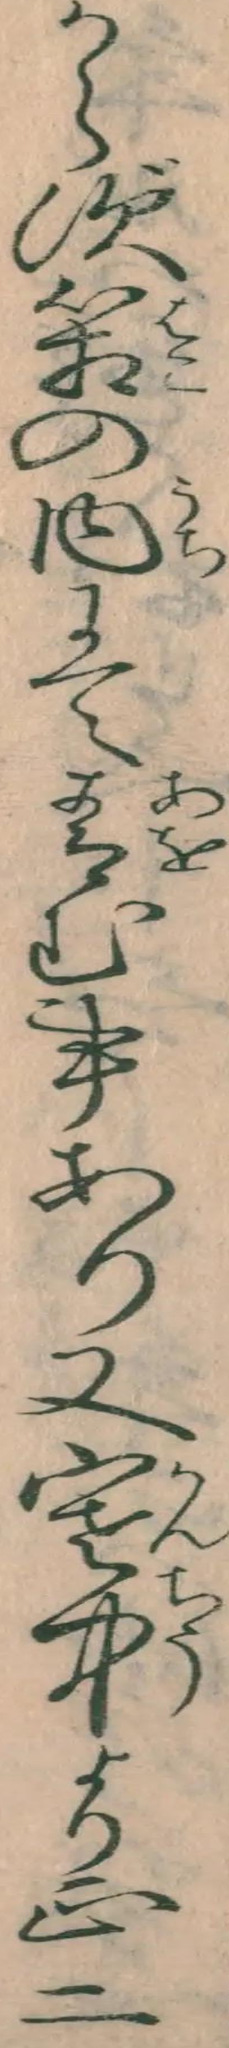からず箱の内にて青む事あり又寒中より正二
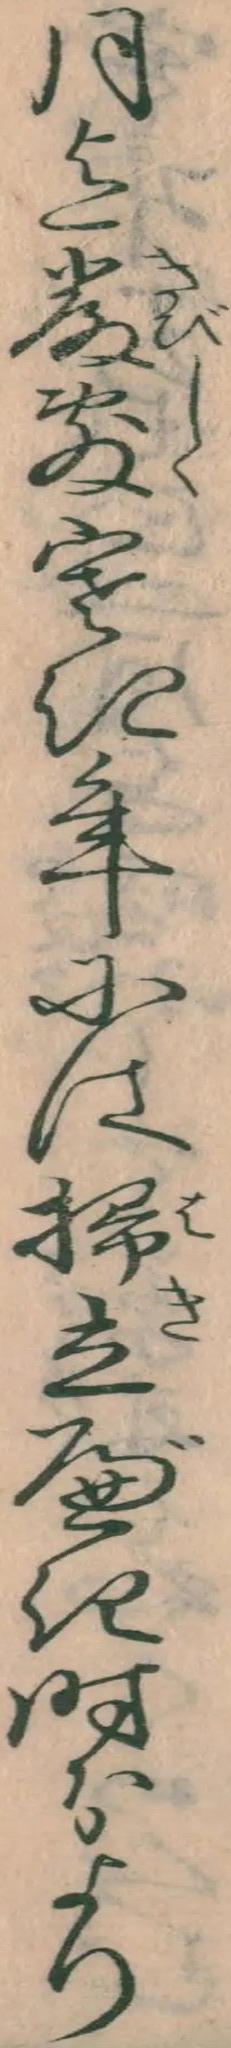月迄厳敷寒き年には掃立べき時分より
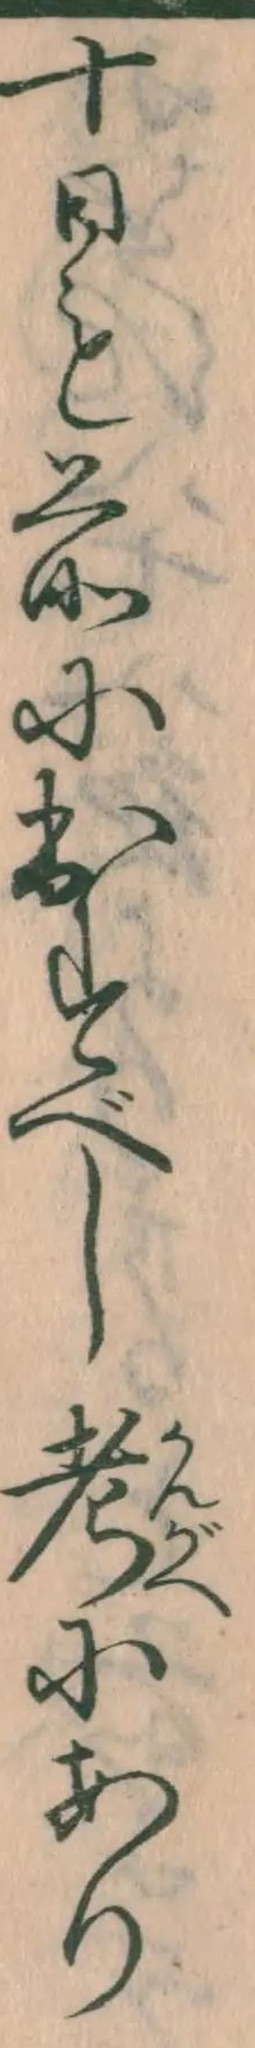十日も前に出すべし考にあり
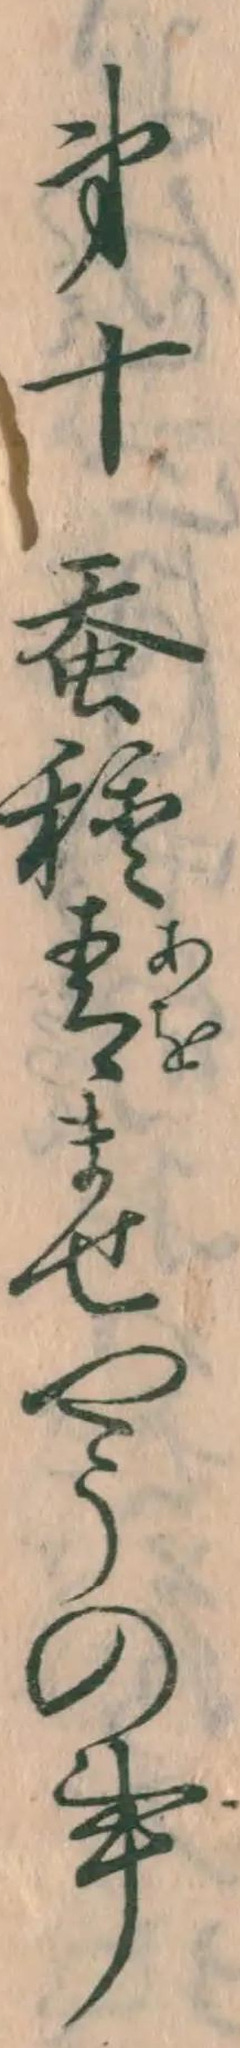第十蚕種青ませやうの事
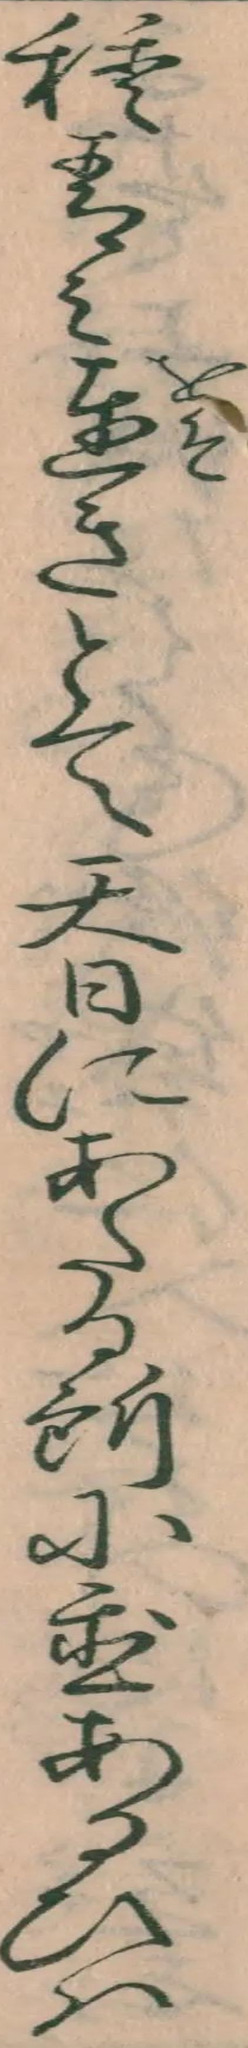種青み遅きとて天日にあたる所に置あるひは
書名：新撰養蚕秘書
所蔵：国立国会図書館 National Diet Library, JAPAN
